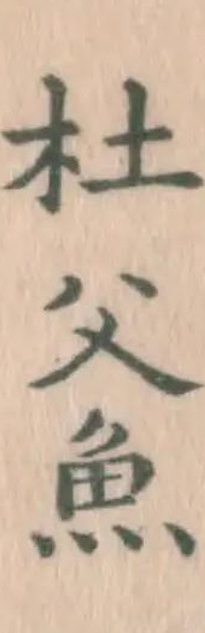杜父魚
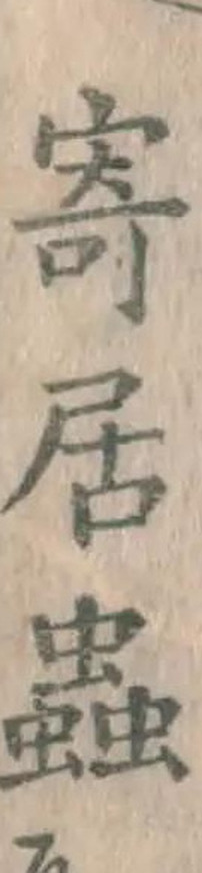寄居虫

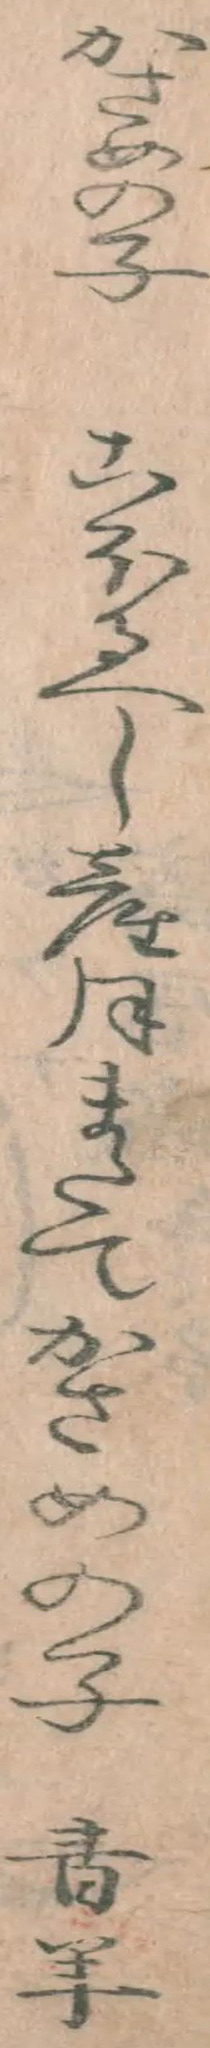かさめの子こほるへし産月またてかさめの子青羊
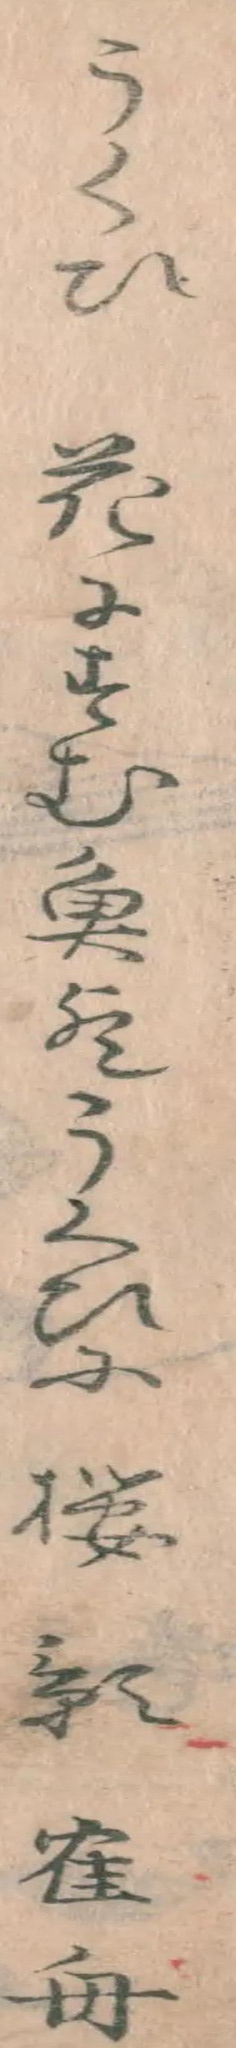うくひ花にすむ魚はうくひに桜影隺舟
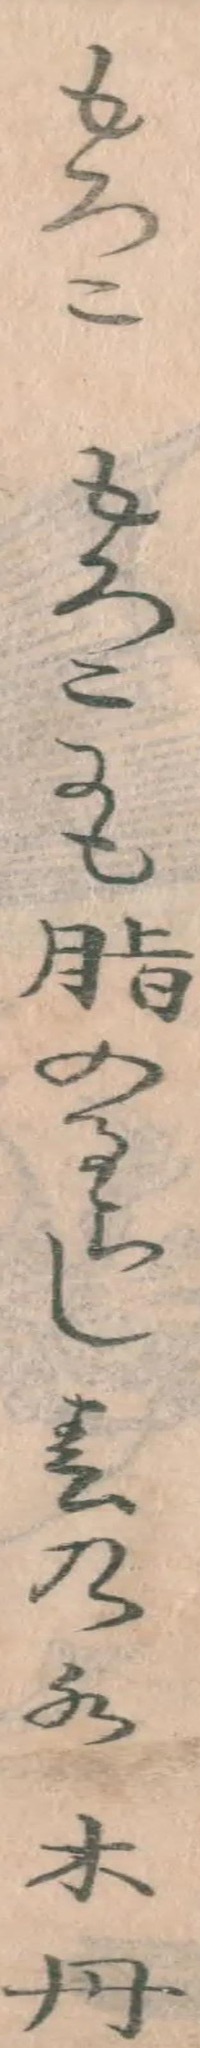もろこもろこにも脂のるらし春の水木丹
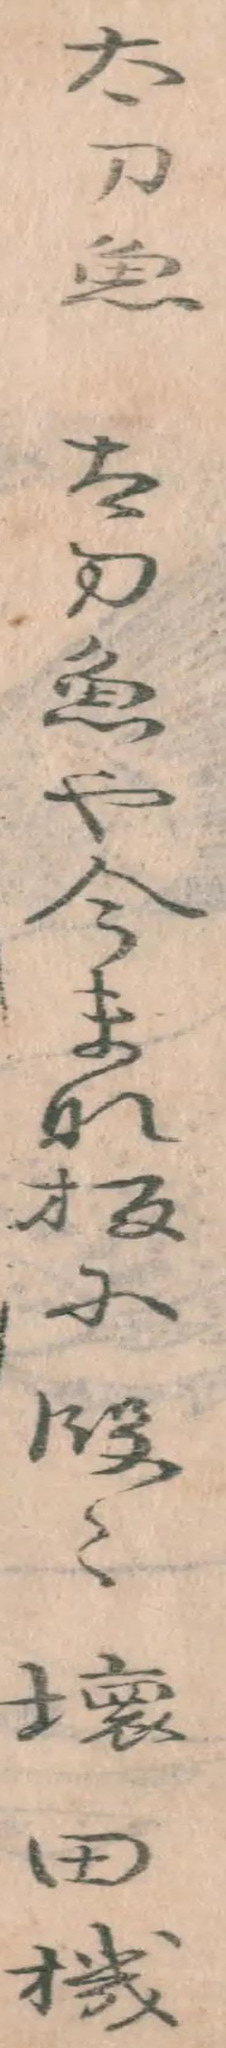太刀魚太刀魚や今まな板に段々懐田機
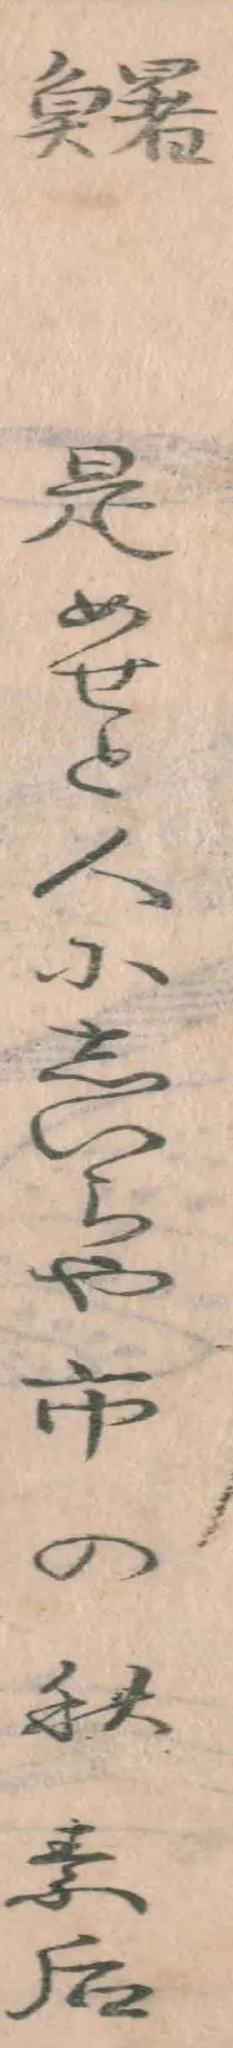鱪是めせと人にしいらや市の秋素后
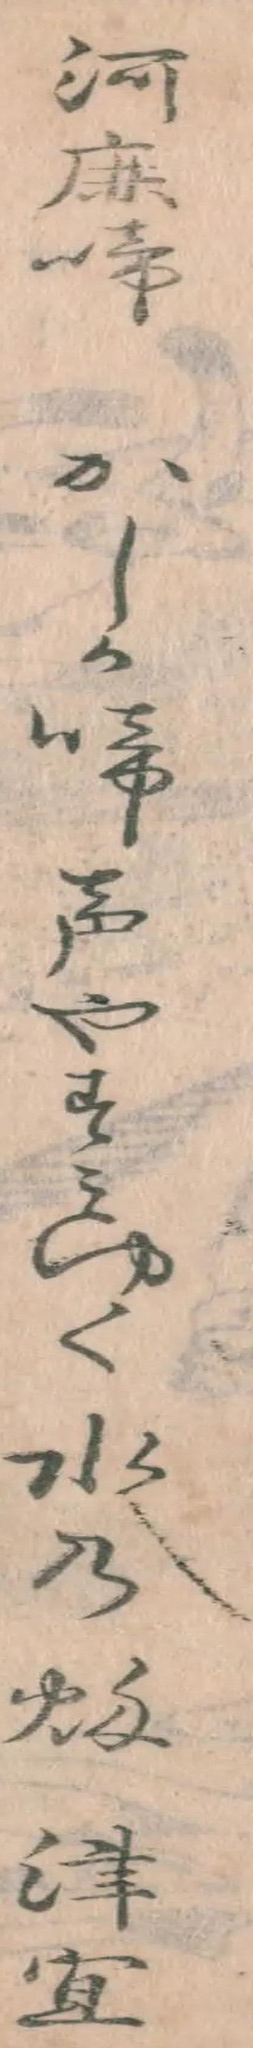河鹿啼かしか啼声やすみゆく水の秋津宜
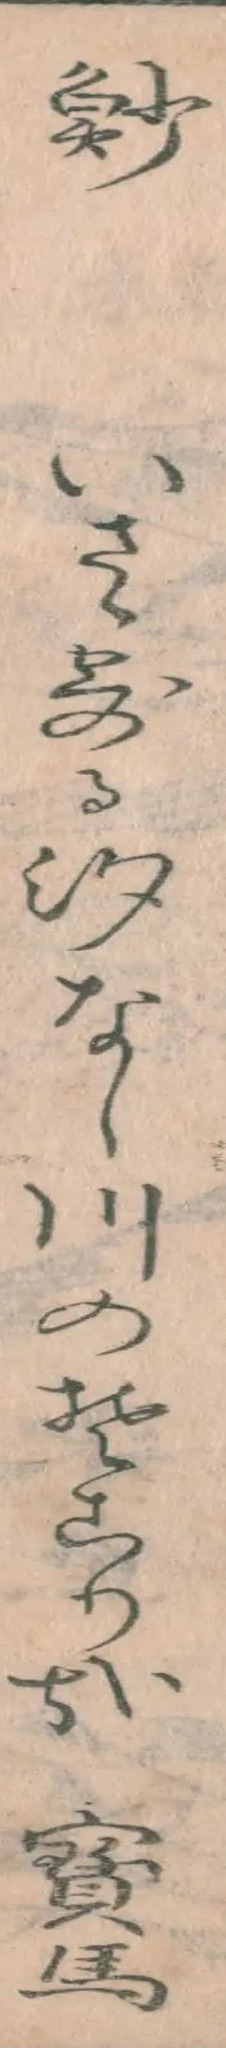魦いさゝ寄る汐なし川のそこり哉寶馬
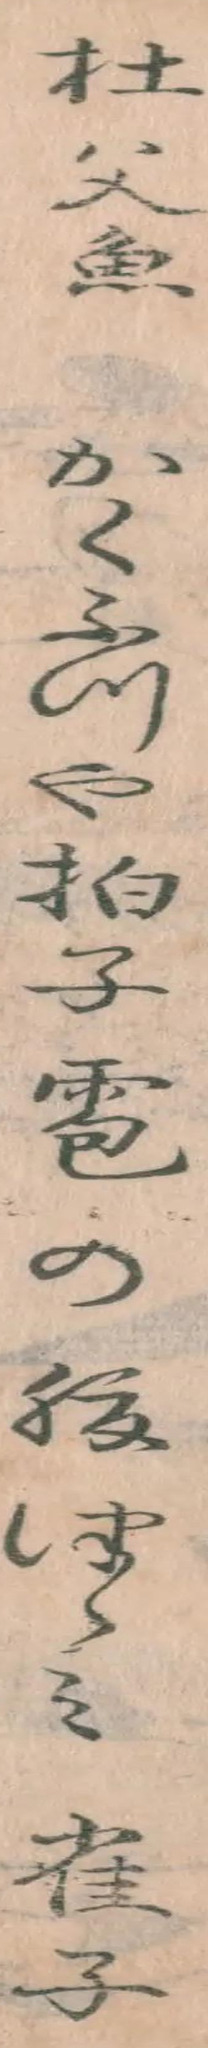杜父魚かくふつや拍子雹の腹つゝみ雀子
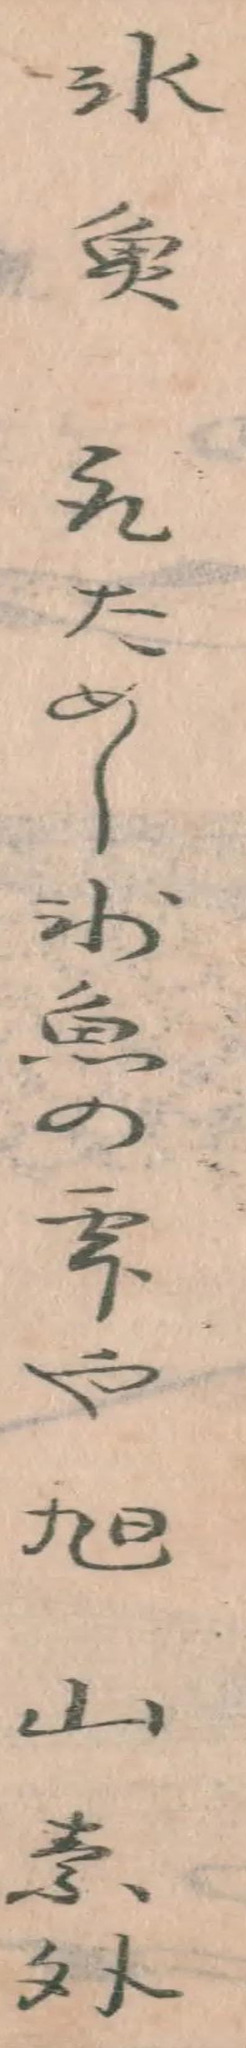氷魚取ためし氷魚の雫や旭山素外
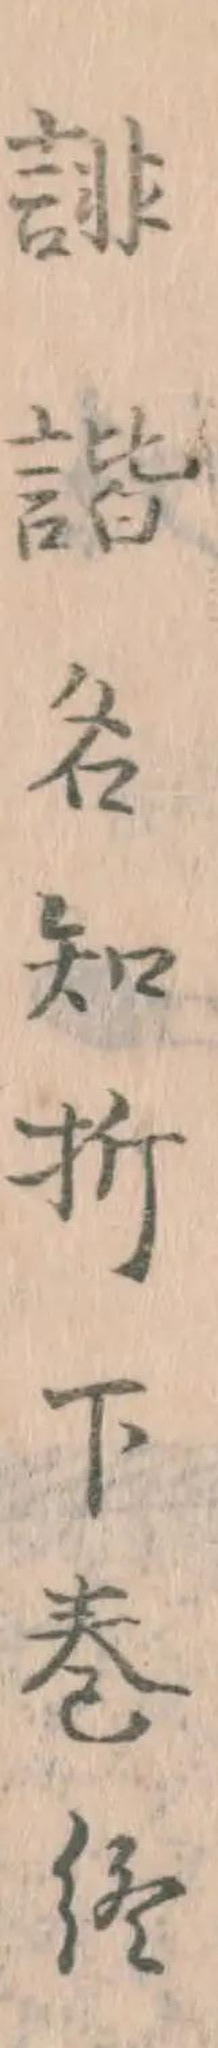誹諧名知折下巻終
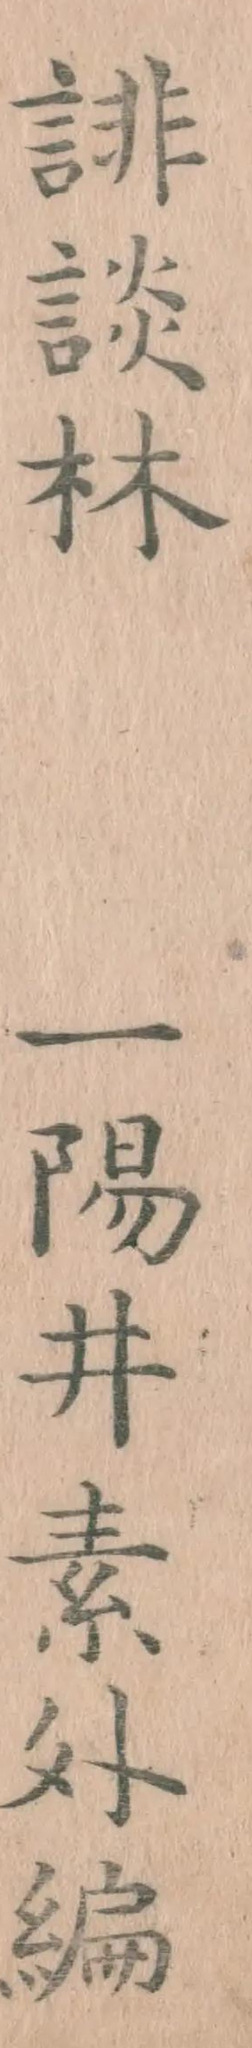誹談林一陽井素外編
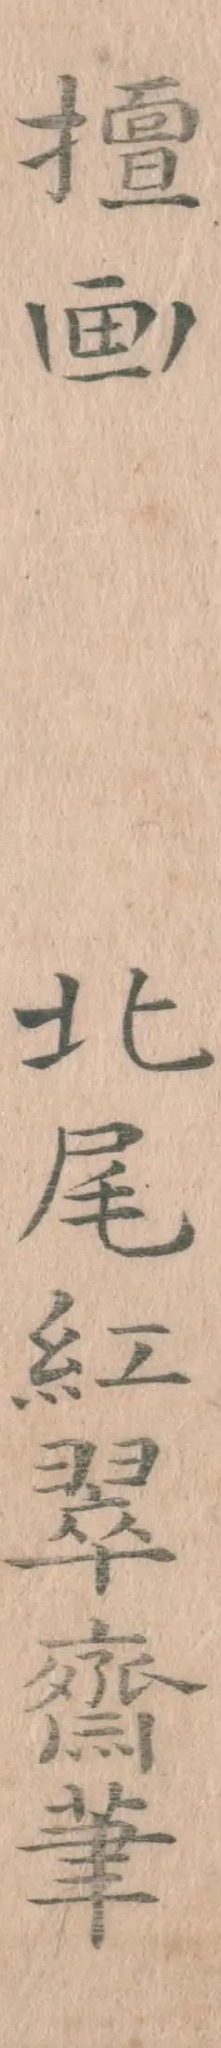擅画北尾紅翠齋茟
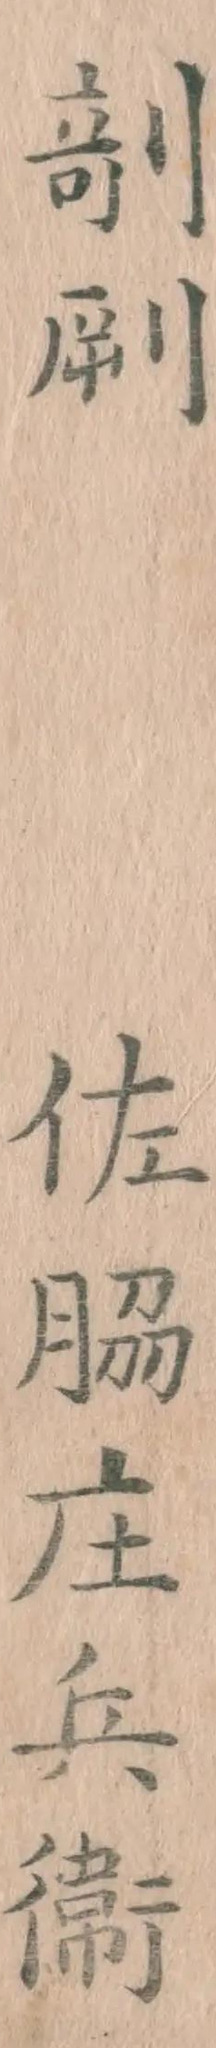剞刷佐脇庄兵衛
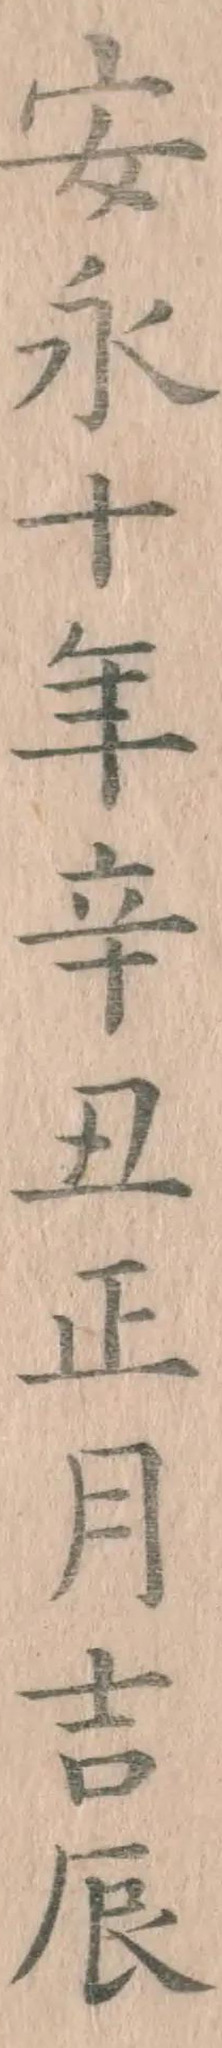安永十年辛丑正月吉辰
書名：誹諧名知折 2巻. [2]
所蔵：国立国会図書館 National Diet Library, JAPAN
